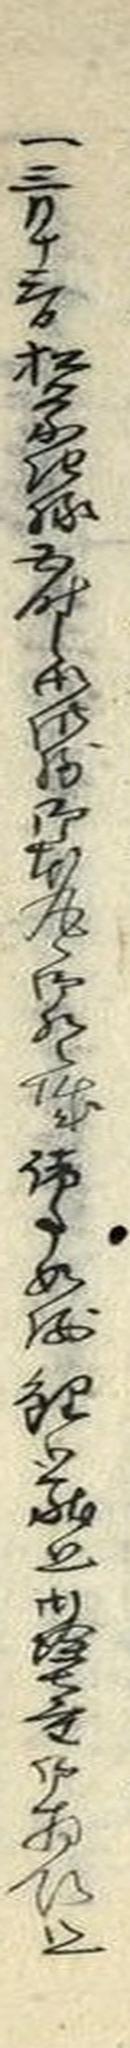一三月十三日松栄院様五時之御供揃御本丸へ御登城諸事如例鯉御献上御塗重御拝領且

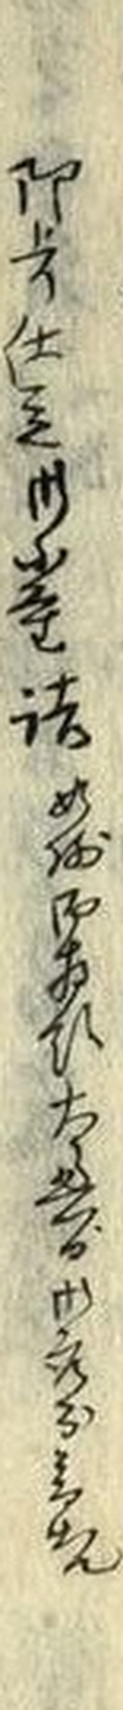御上り仕立御小重詰如例御拝領大奥ゟ御取分ニ而出ル
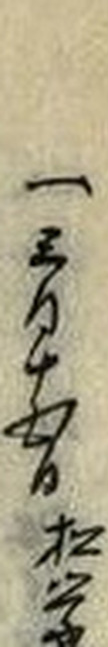一三月十五日
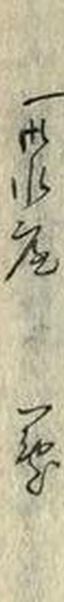御水屋一台
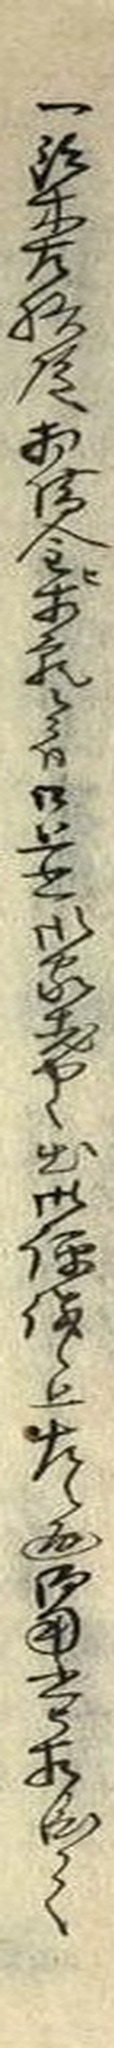一鈴木左膳殿拝借金被相願候ニ付御上書御家老中へ出御評議之上左之通御用書被相渡之
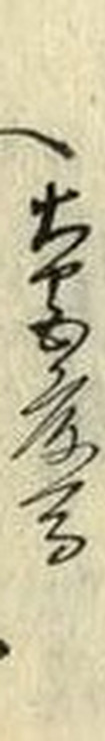大宮藤馬
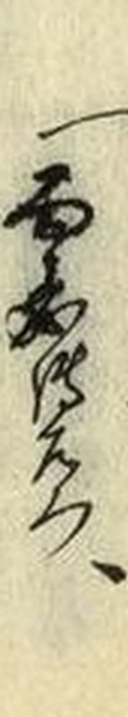雨森伝左衛門へ
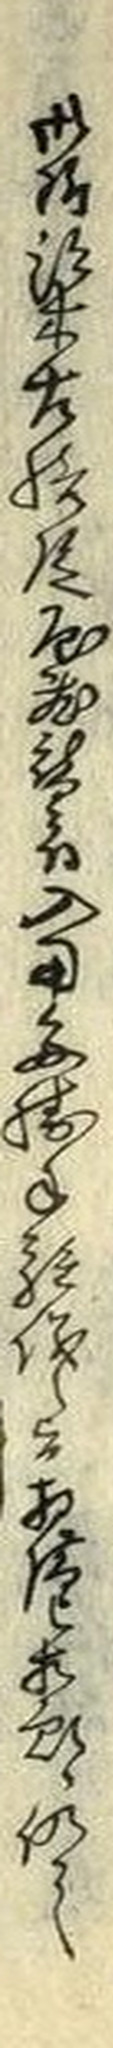御附鈴木左膳殿屋敷替ニ付入用多勝手難儀之旨拝借被相願候依之
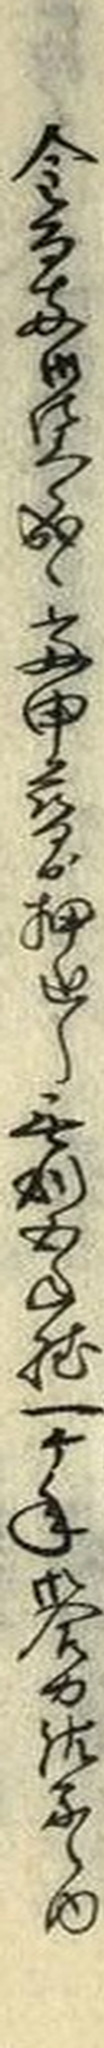金百両御貸被成候当申暮ゟ押廻し無利五年賦一ケ年御合力銀米之内
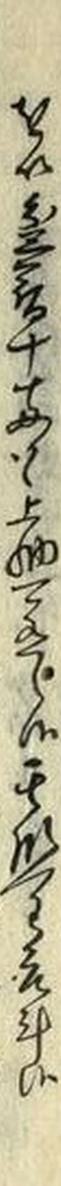を以盆暮十両ツヽ上納可有之候其段可被取計候三月
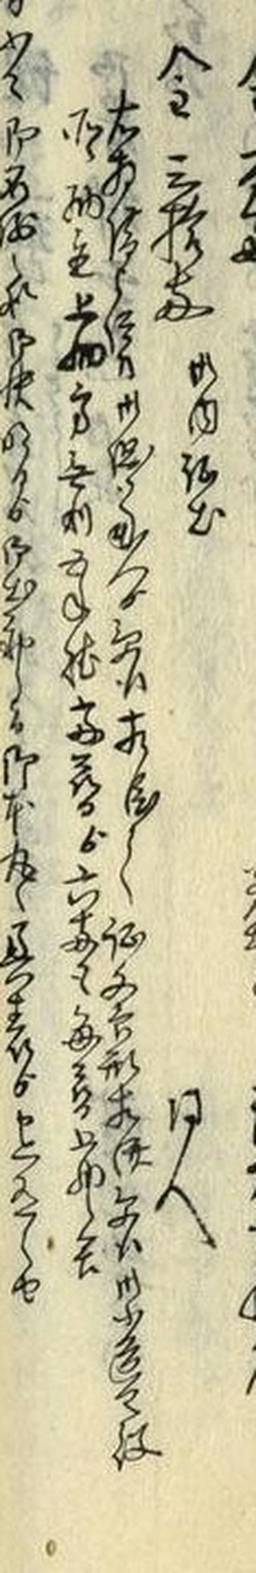右拝借被仰付御側御用人ゟ受取相渡之証文印形相済受取御小道具役
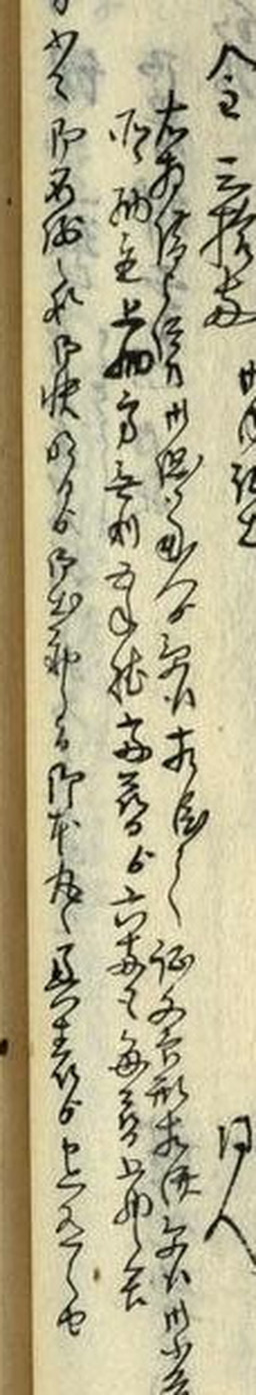所へ納置上納方無利五年賦当暮ゟ六両ツヽ毎暮上納之筈
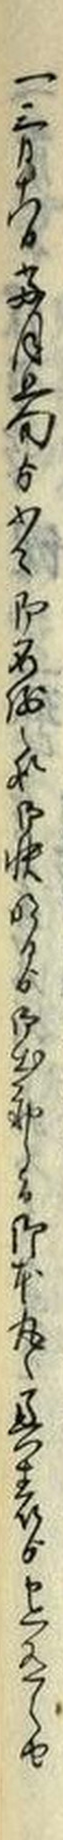一三月十八日当月上旬ゟ少々御不例之処御快明日ゟ御出勤之旨御本丸へ奥表ゟ申上有之由
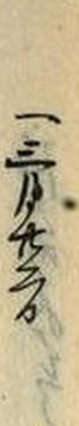一三月十五日
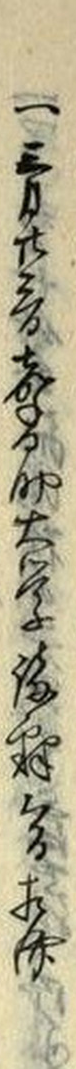一三月廿三日馨助大学講釈今日相済
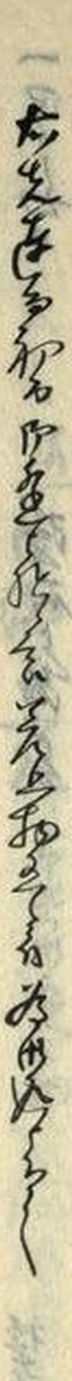右先達而初而御逢被遊候節差上物有之ニ付為御返被進之
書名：少傅日録抄（斉善付側向頭取日記、在府）
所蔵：福井県文書館 Fukui Prefectural Archives
